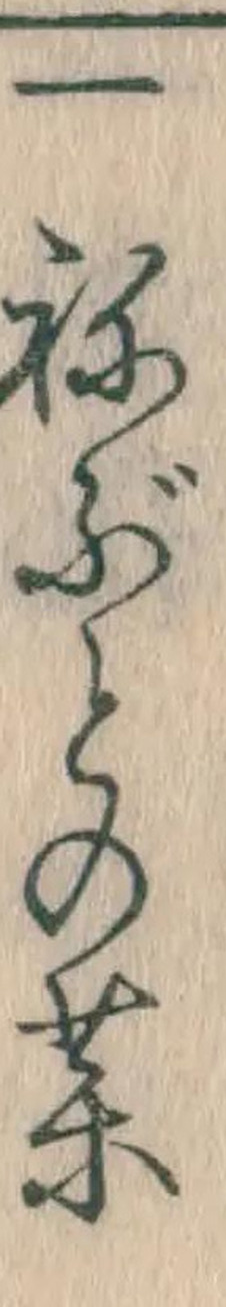一ねぶとの薬
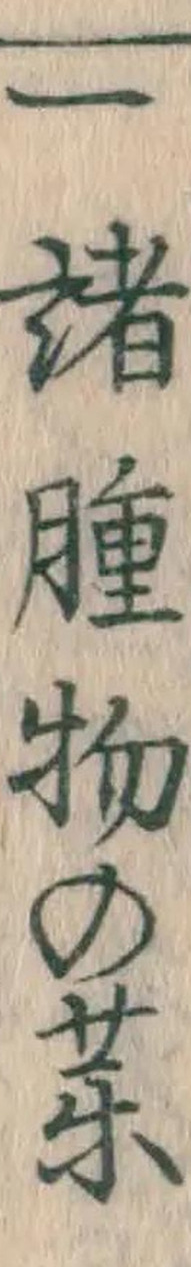一腫気の薬
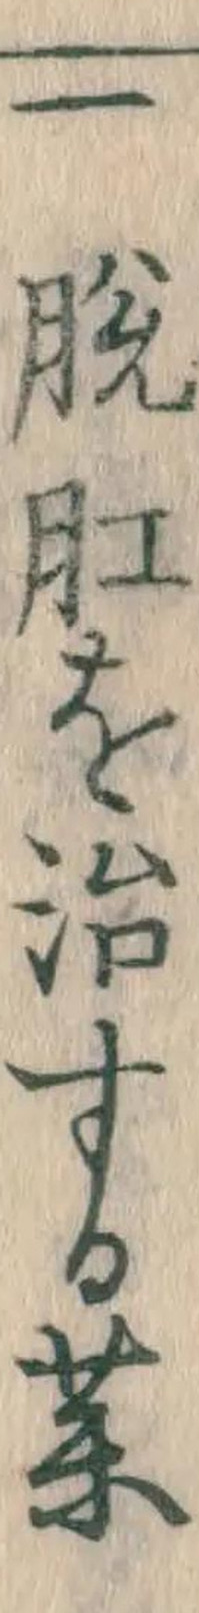一脱肛を治する薬
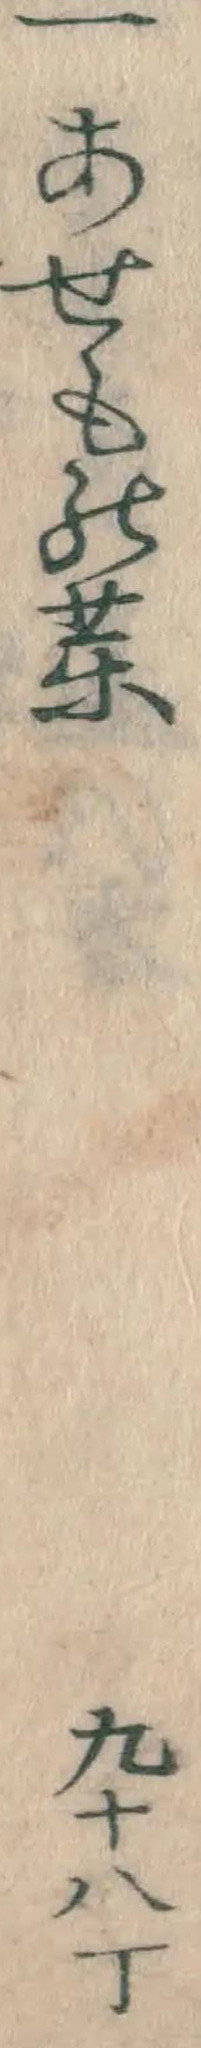一あせもの薬九十八丁

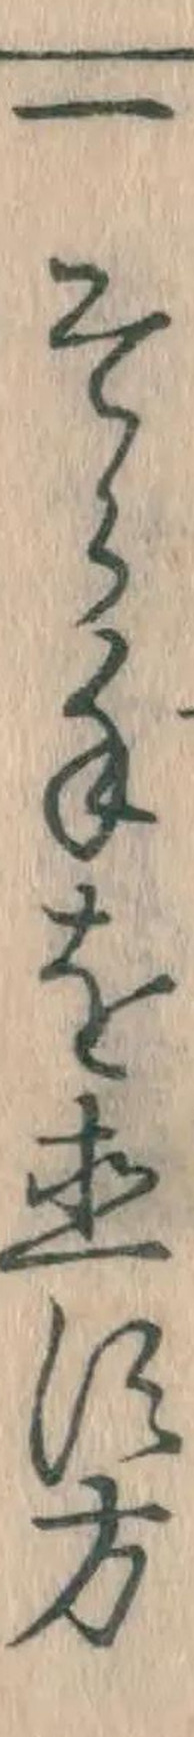一そら手を直す方
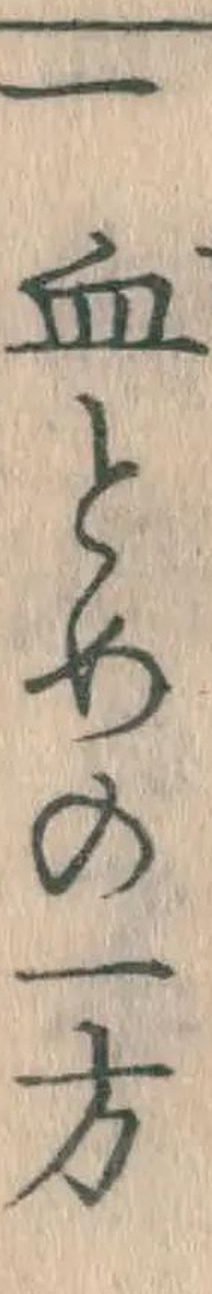一血とめの一方
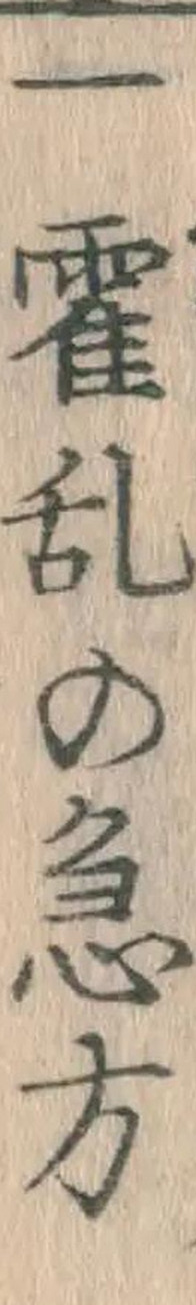一霍乱の急方
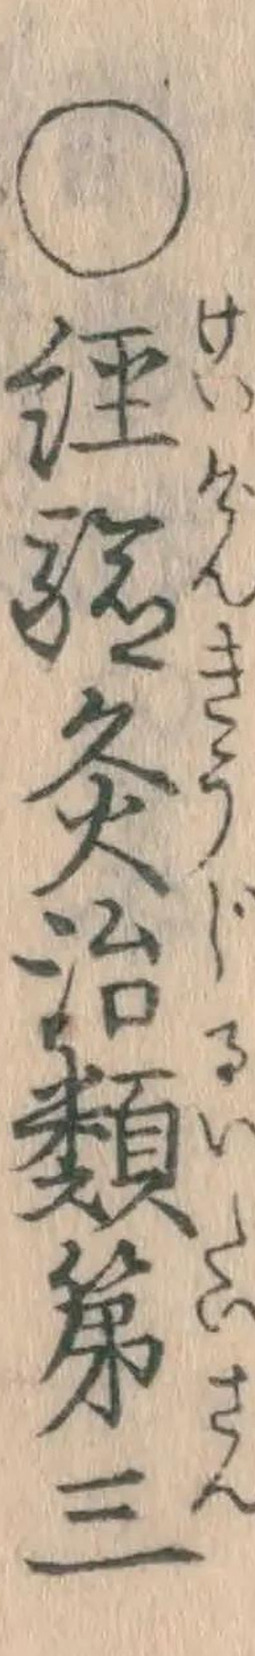○経験灸治類第三
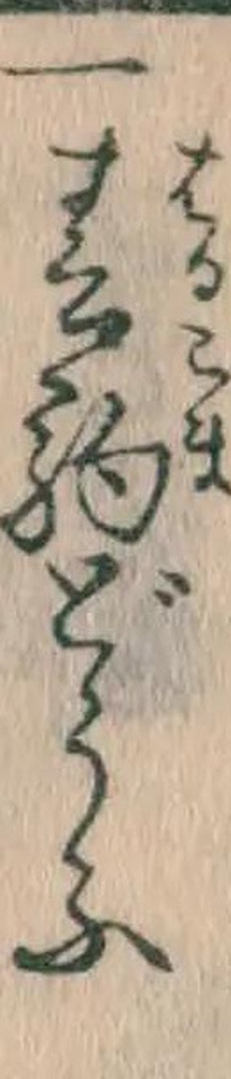一春駒どうふ
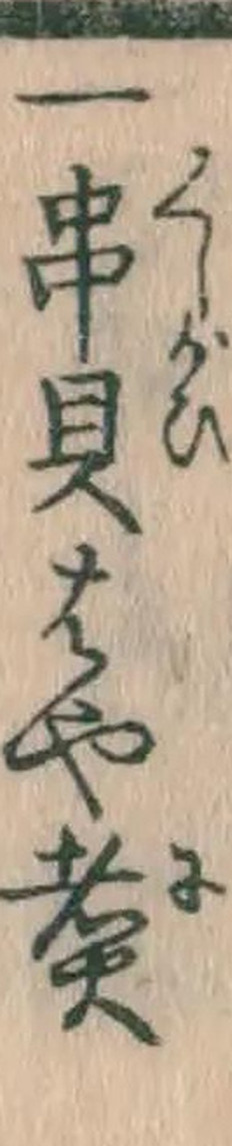一串貝はや煮
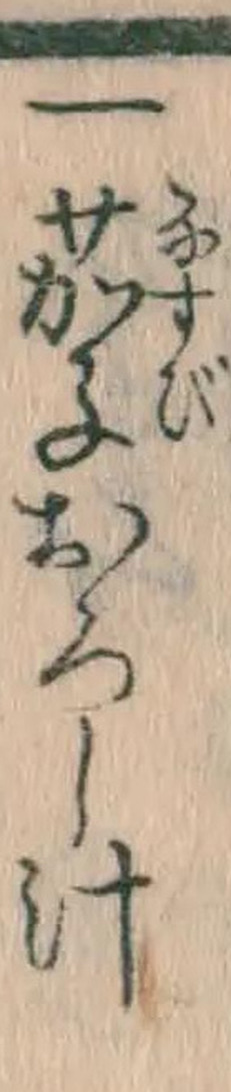一茄子おろし汁
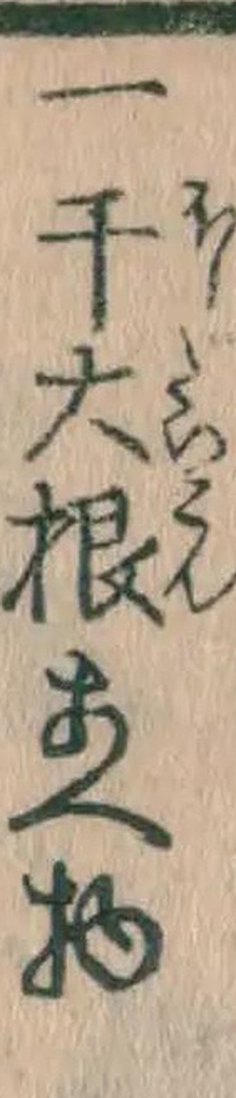一干大根あへ物
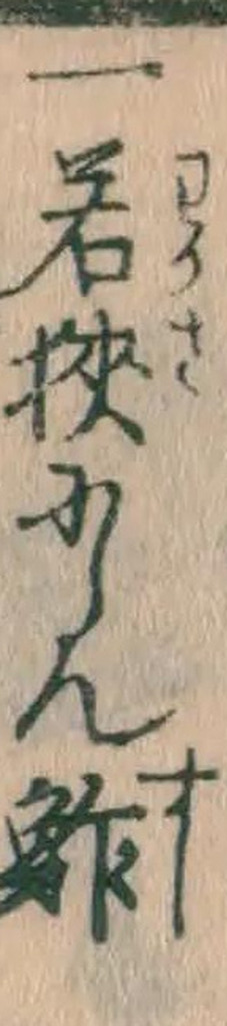一若狭にしん鮓
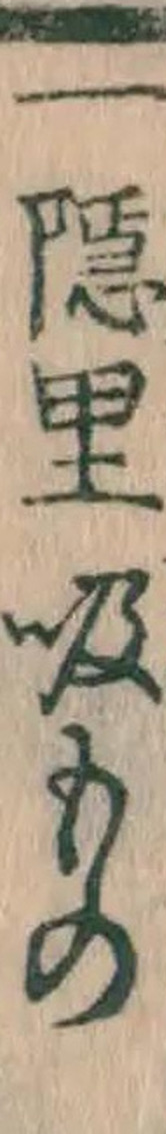一隠里吸もの
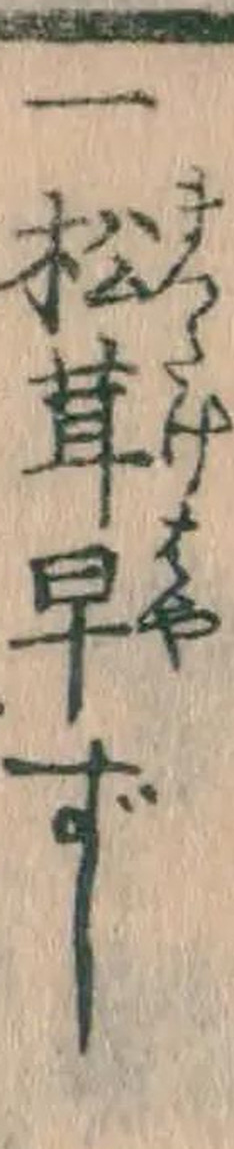一松茸早ずし
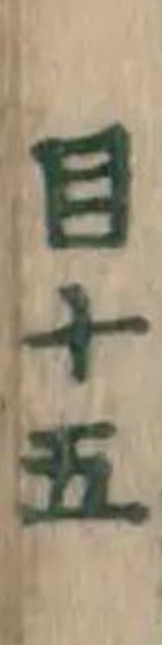目十五
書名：広益秘事大全 3巻. [1]
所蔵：国立国会図書館 National Diet Library, JAPAN
